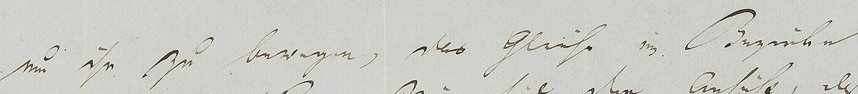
um ihn zu bewegen, das Gleiche im Bezirke
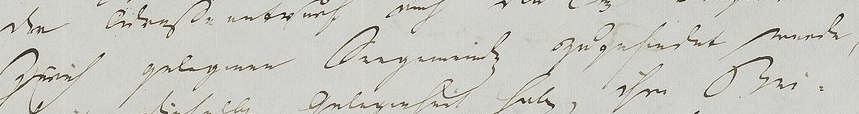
Zürich gelegenen Seegemeinden zugesendet werde,
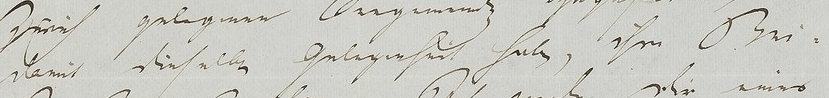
damit dieselben Gelegenheit haben, ihre Bei-
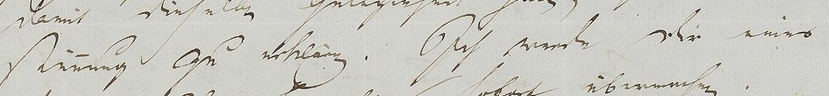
stimmung zu erklären. Ich werde Dir eines
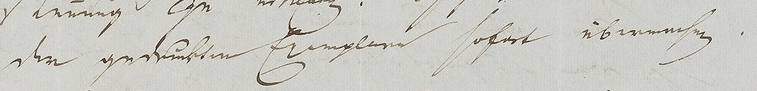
der gedruckten Exemplare sofort übermachen.
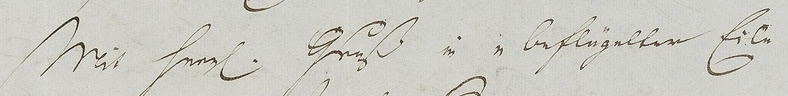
Mit herzl. Gruß in «beflügelter Eile»
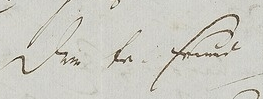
dein tr. Freund
